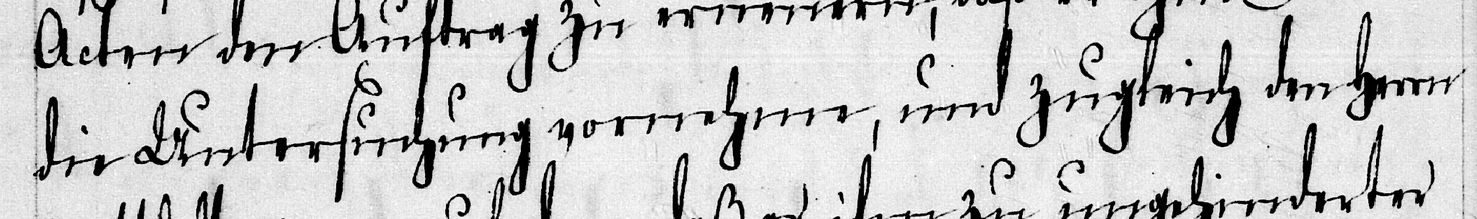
die Untersuchung vornehme, und zugleich den Herrn
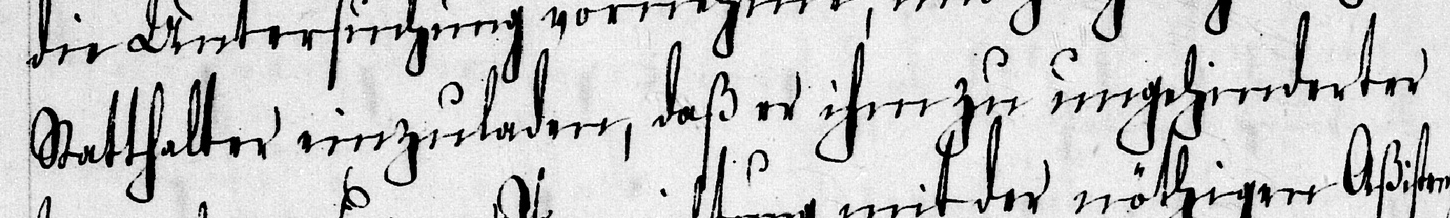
Statthalter einzuladen, daß er ihm zu ungehinderter
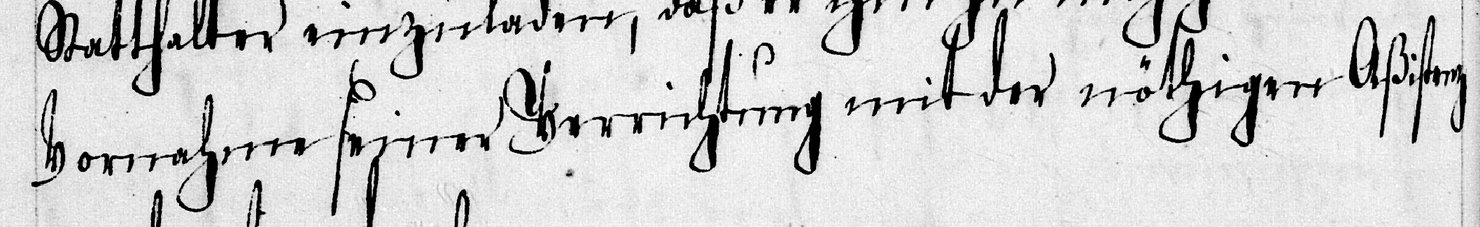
Vornahme seiner Verrichtung mit der nöthigen Aßis¬
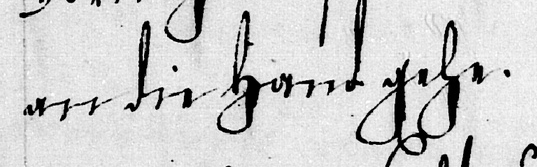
an die Hand gehe.
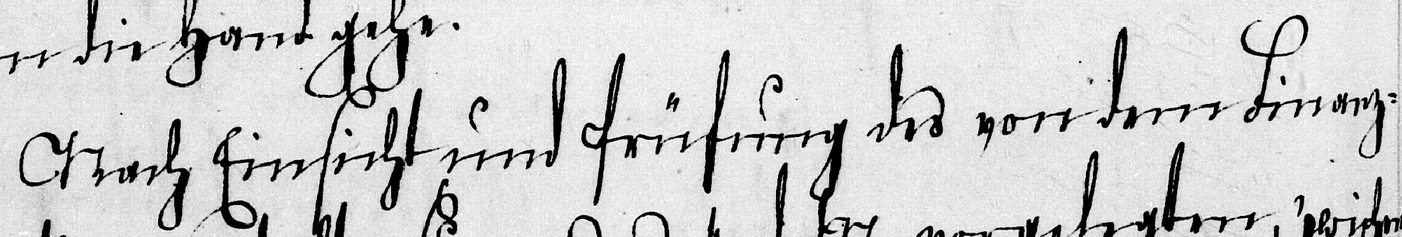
Nach Einsicht und Prüfung des von dem Finan¬
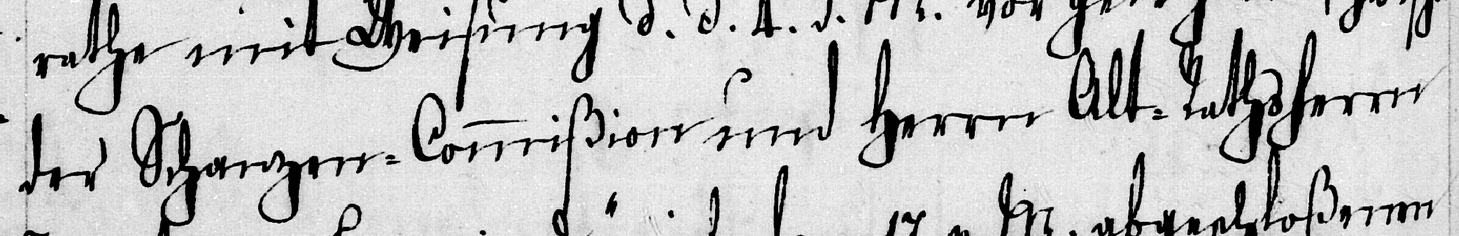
der Schanzen-Commißion und Herrn Alt-Rathsherrn
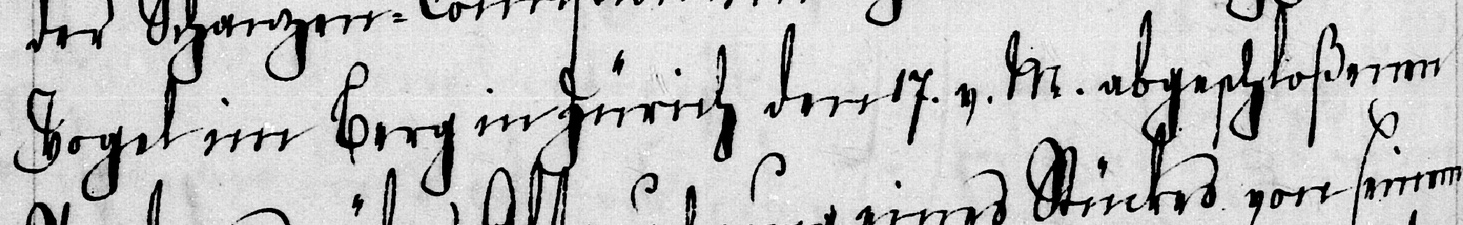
Vogel im Berg in Zürich den 17. v. M. abgeschloßenen
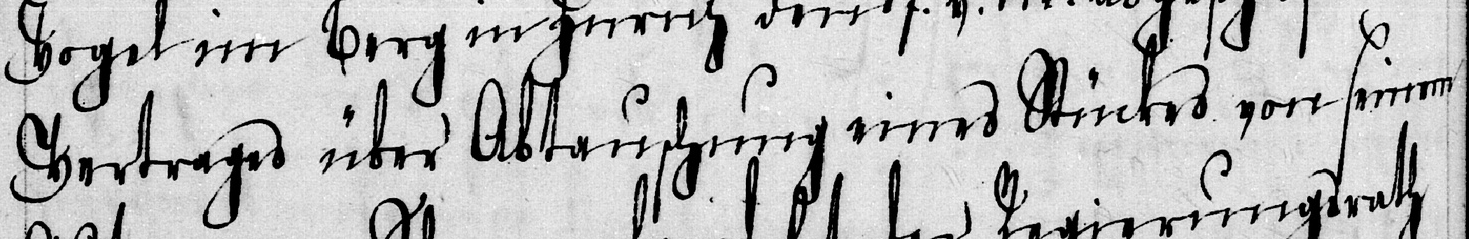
Vertrages über Abtauschung eines Stückes von seinem
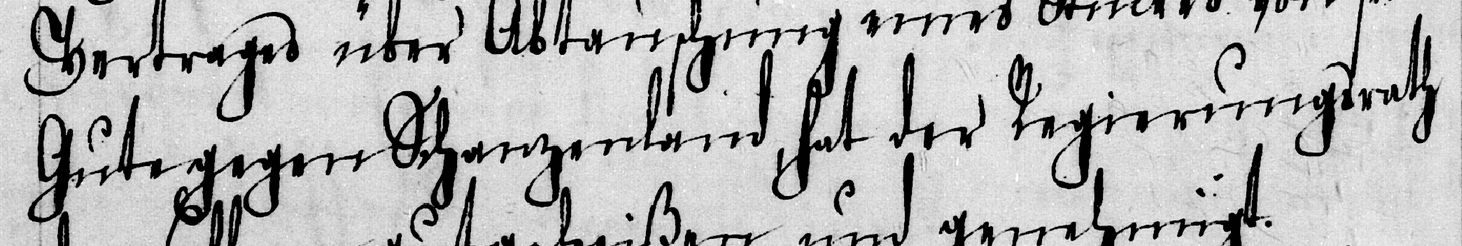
Gute gegen Schanzenland, hat der Regierungsrath
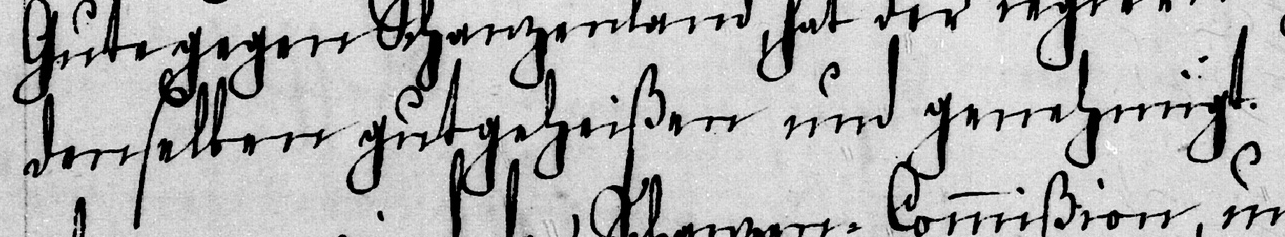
denselben gutgeheißen und genehmigt.
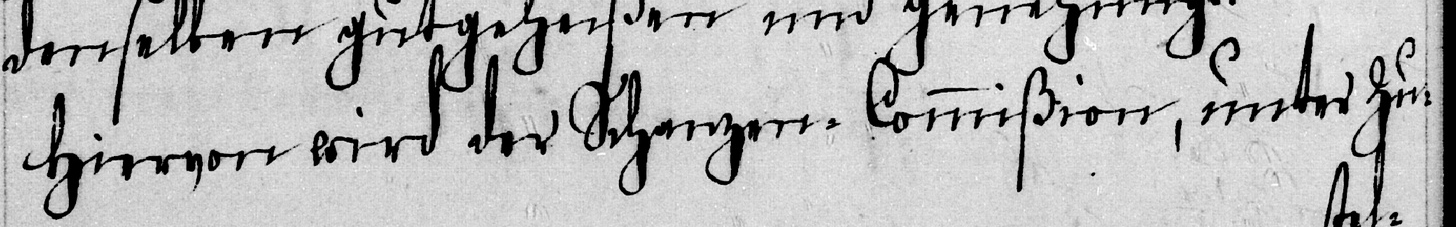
Hiervon wird der Schanzen-Commißion, unter Zu-
